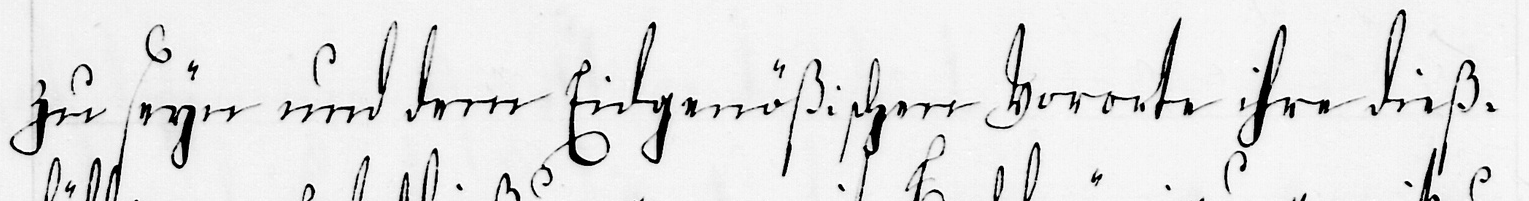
zu seyn und dem Eidgenößischen Vororte ihre dieß¬
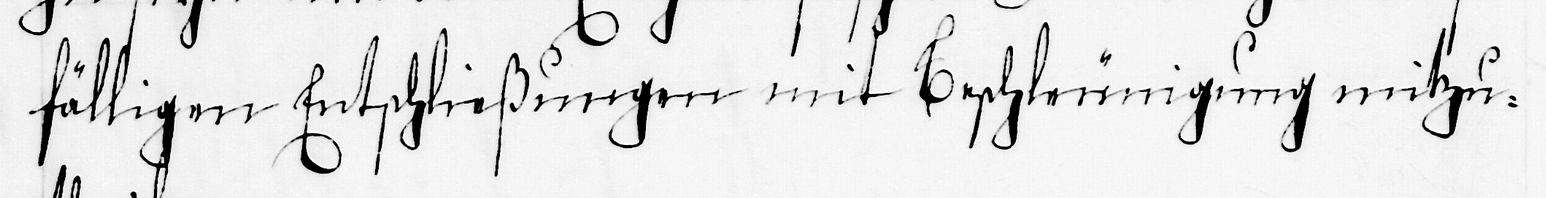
fälligen Entschließungen mit Beschleunigung mitzu¬
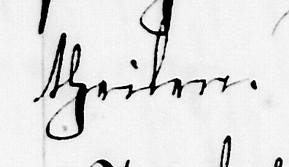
theilen.
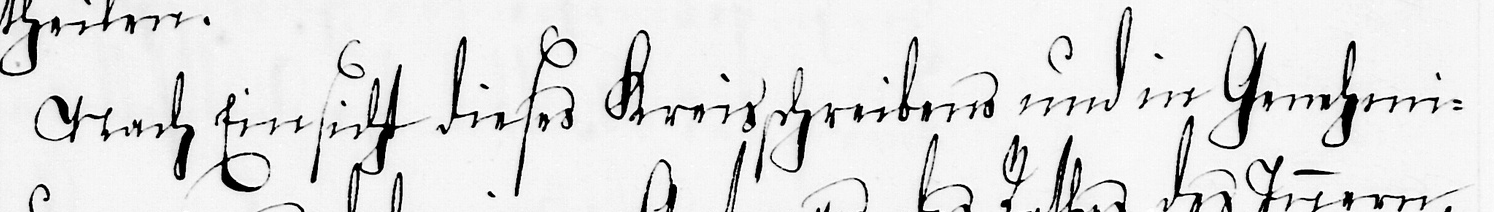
Nach Einsicht dieses Kreisschreibens und in Genehmi¬
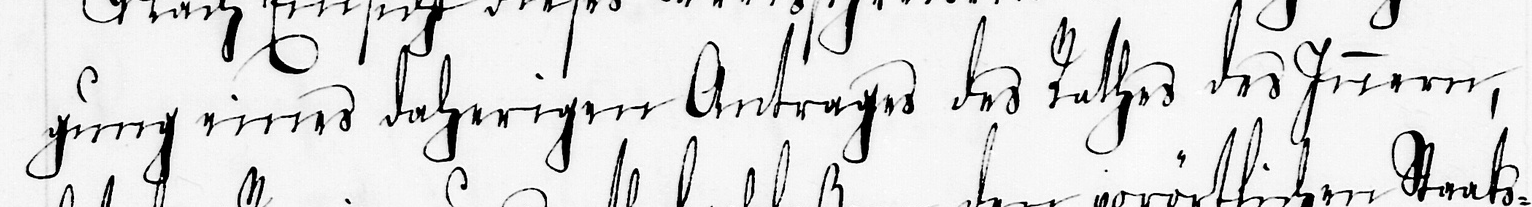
gung eines daherigen Antrages des Rathes des Innern,
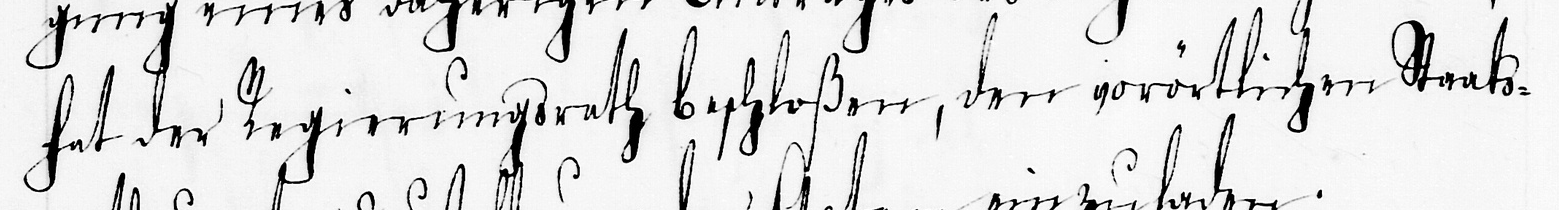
hat der Regierungsrath beschloßen, den vorörtlichen Staat¬
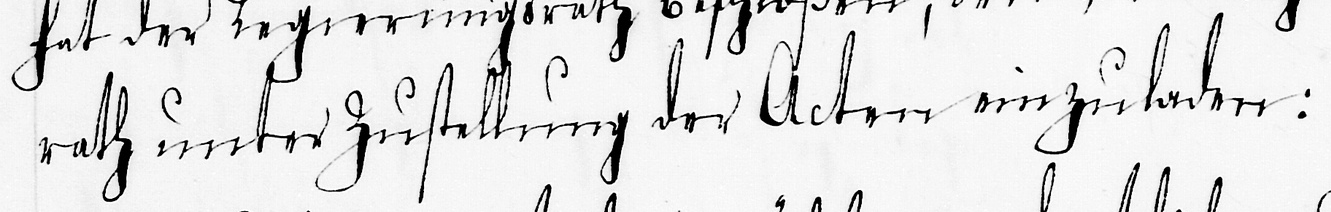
srath unter Zustellung der Acten einzuladen:
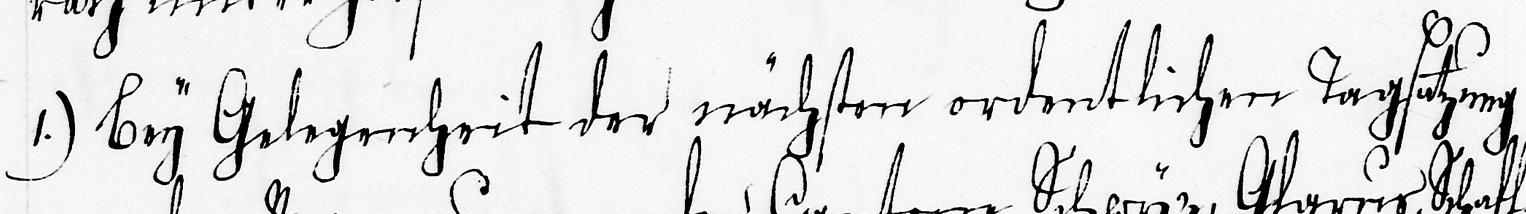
1.) Bey Gelegenheit der nächsten ordentlichen Tagsatzung
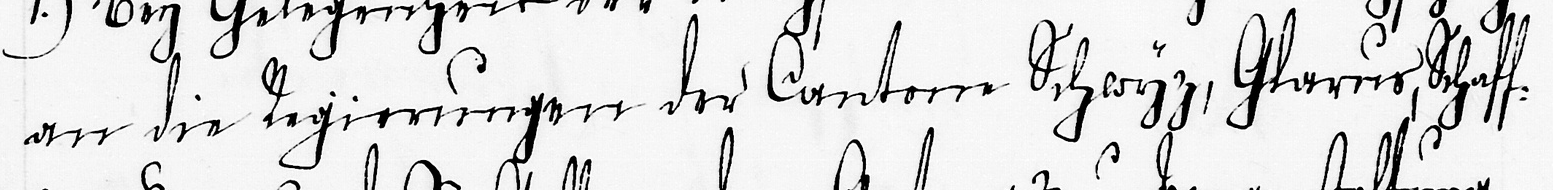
an die Regierungen der Cantone Schwyz, Glarus, Schaf¬
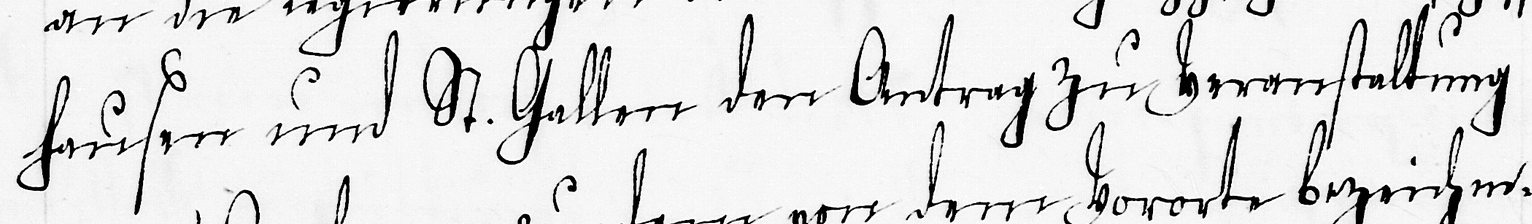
fhausen und St. Gallen den Antrag zu Veranstaltung
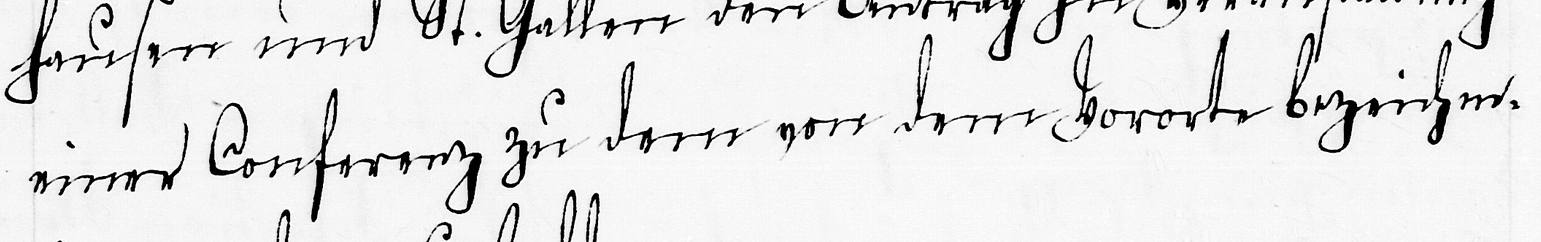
einer Conferenz zu dem von dem Vororte bezeichne¬
